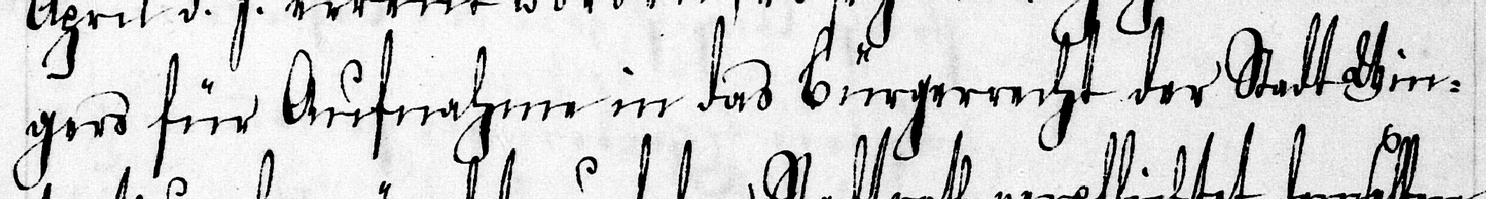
gers für Aufnahme in das Bürgerrecht der Stadt Win¬
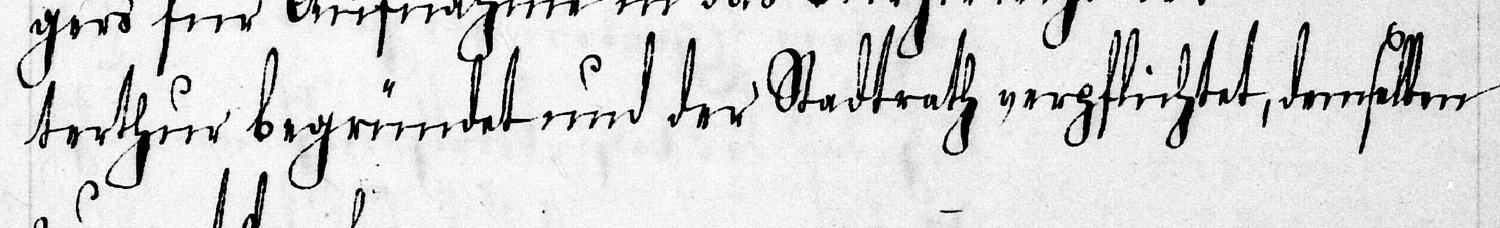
terthur begründet und der Stadtrath verpflichtet, demselb¬
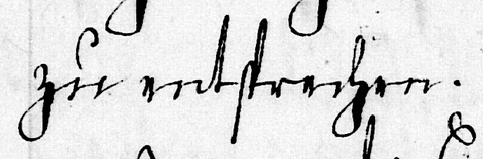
zu entsprechen.
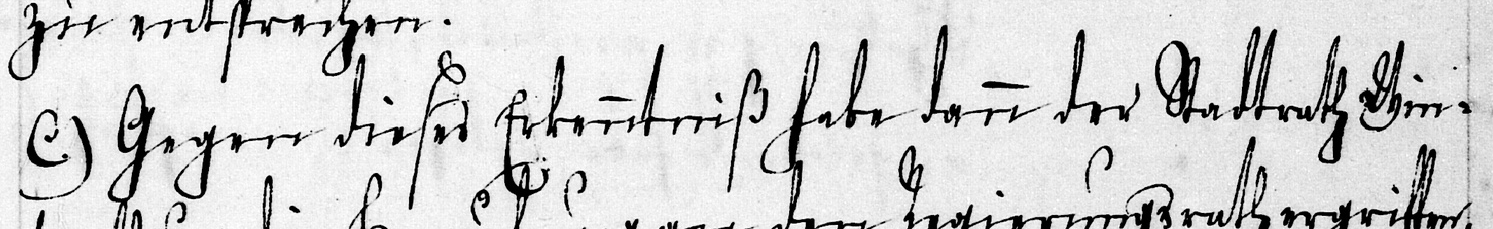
C.) Gegen dieses Erkenntniß habe dann der Stadtrath Win¬
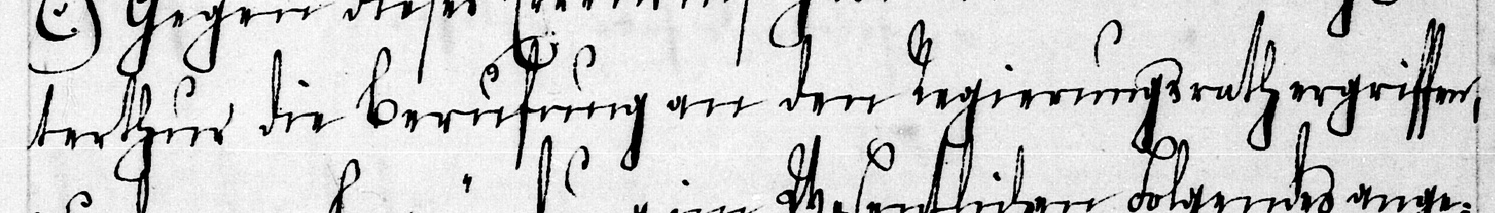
terthur die Berufung an den Regierungsrath ergriffen,
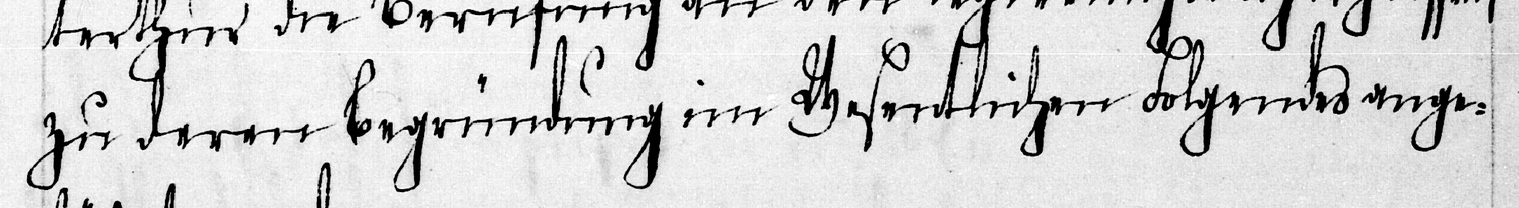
zu deren Begründung im Wesentlichen Folgendes ange¬
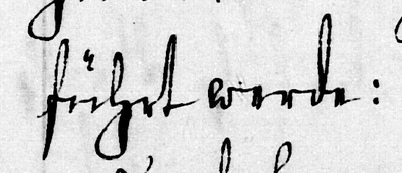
führt werde:
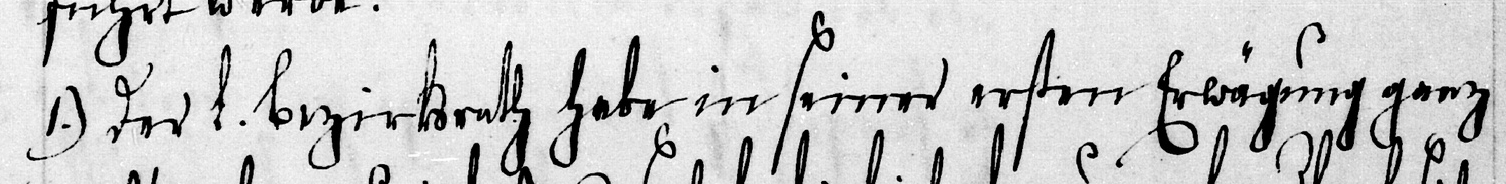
1.) Der L. Bezirksrath habe in seiner ersten Erwägung ganz
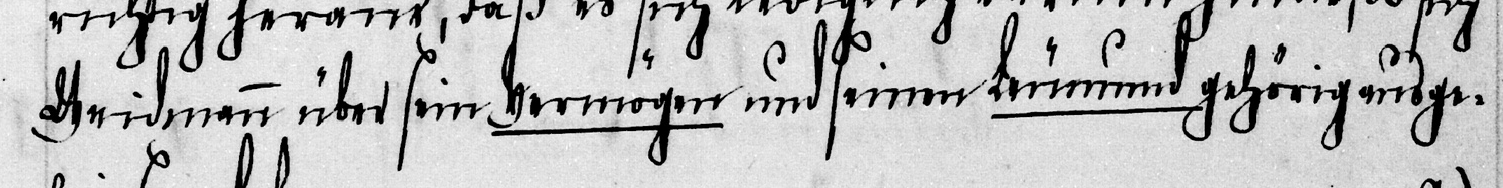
Weidmann über sein Vermögen und seinen Leumund gehörig ausge¬
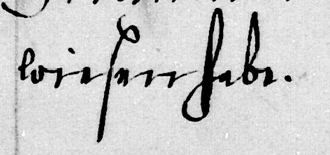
wiesen habe.
